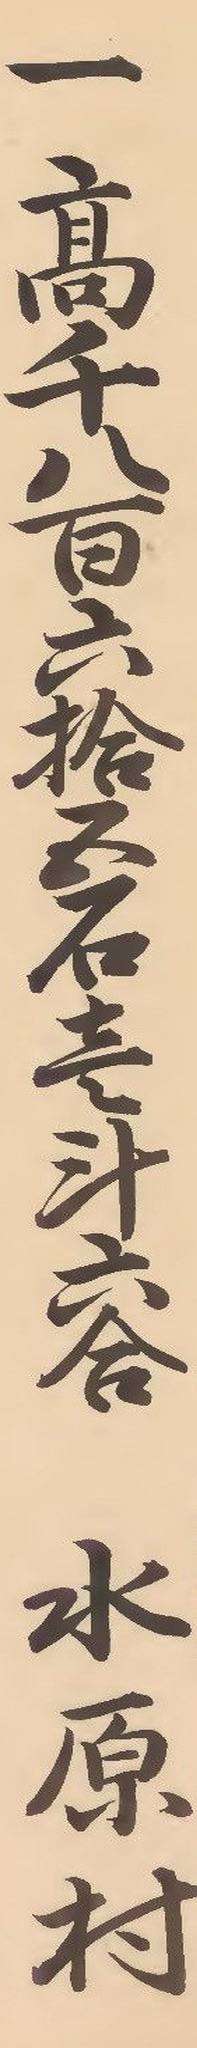一高千八百六拾五石壱斗六合水原村
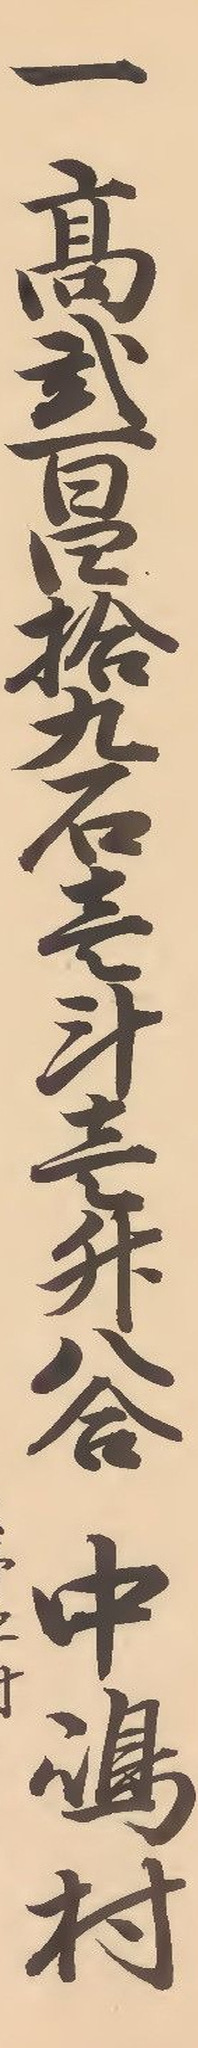一高弐百四拾九石壱斗壱升八合中島村
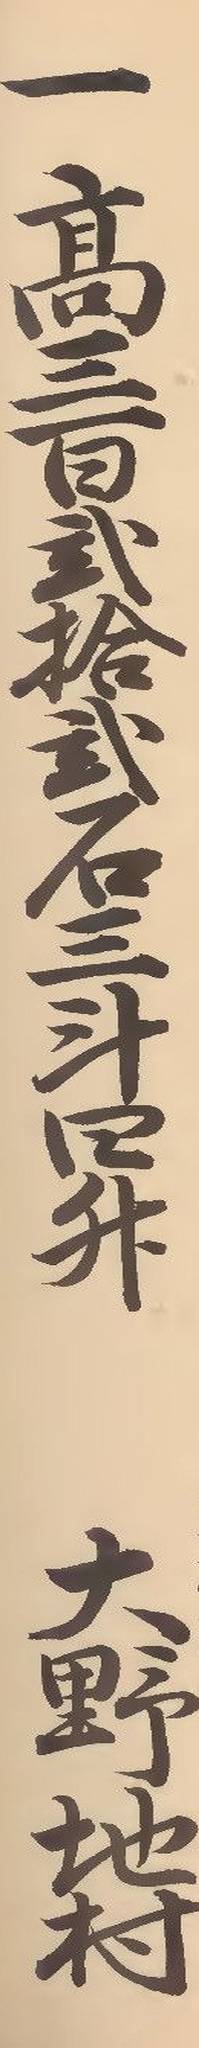一高三百弐拾弐石三斗四升大野地村
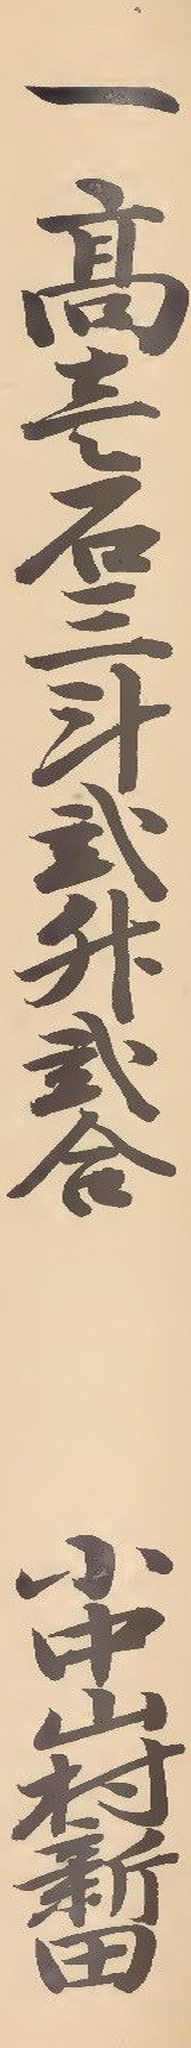一高壱石三斗弐升弐合小中山村新田
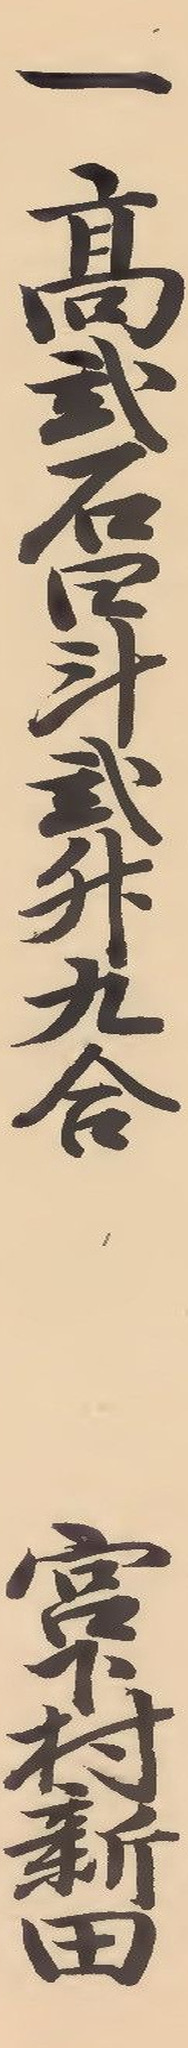一高弐石四斗弐升九合宮下村新田
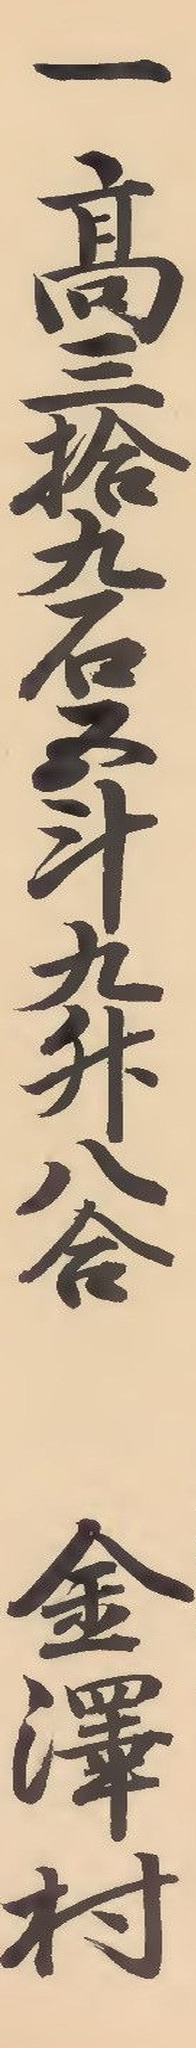一高三拾九石五斗九升八合金沢村
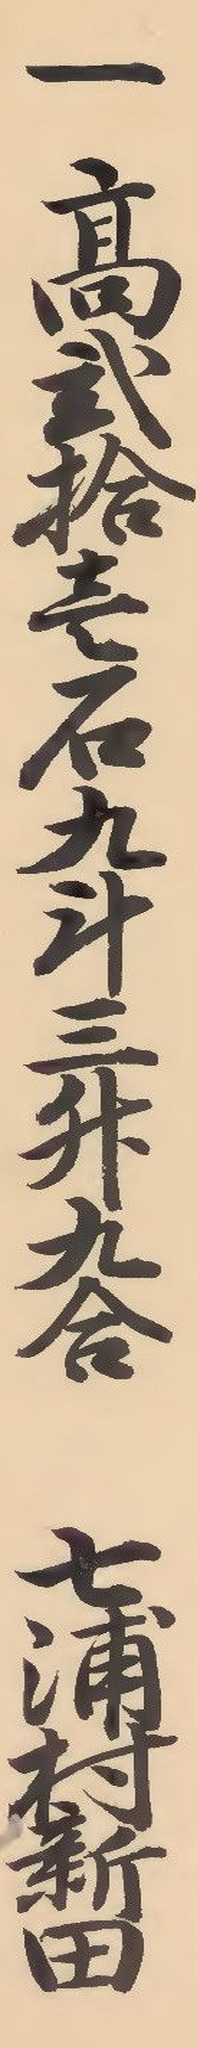一高弐拾壱石九斗三升九合七浦村新田

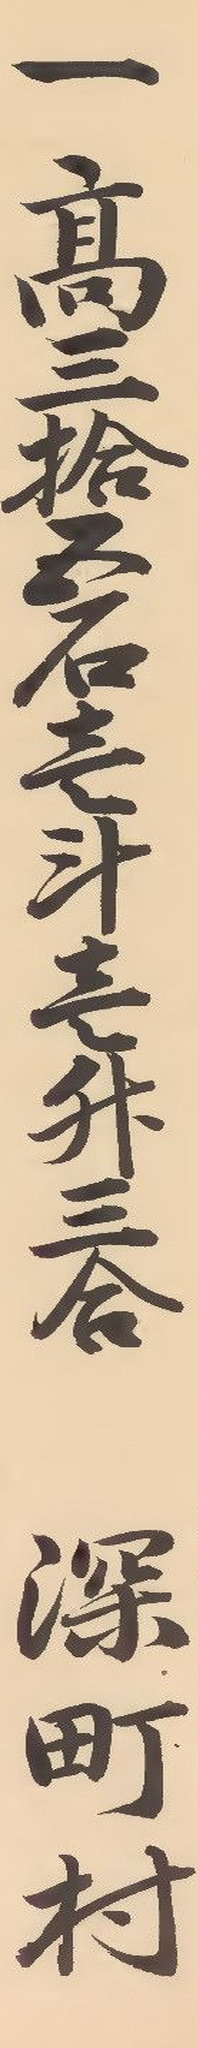一高三拾五石壱斗壱升三合深町村
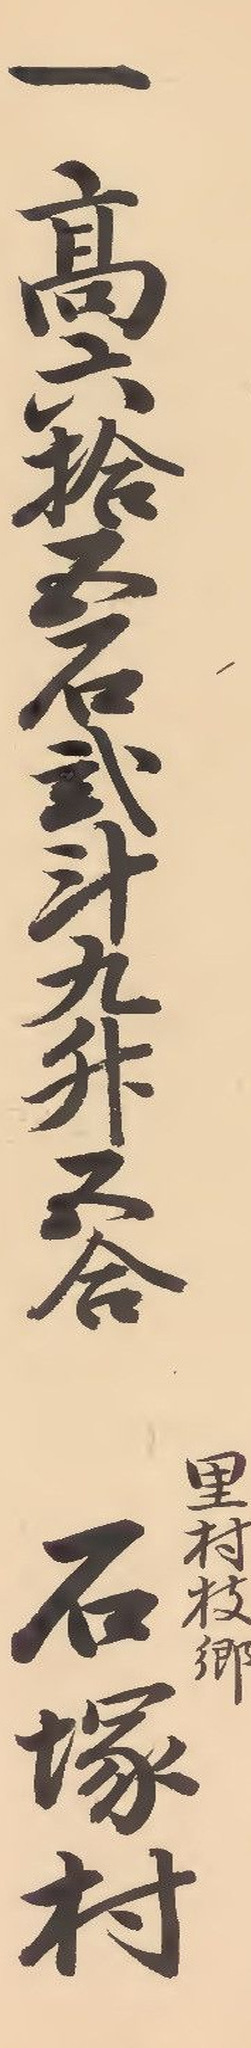一高六拾五石弐斗九升五合石塚村
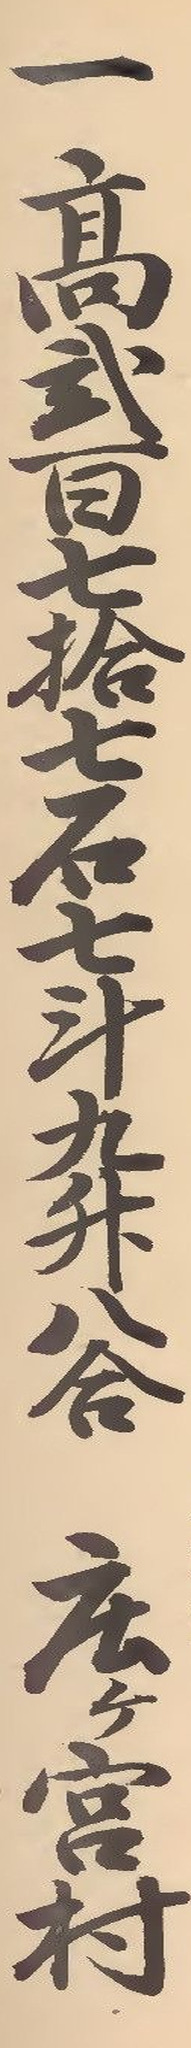一高弐百七拾七石七斗九升八合庄ヶ宮村
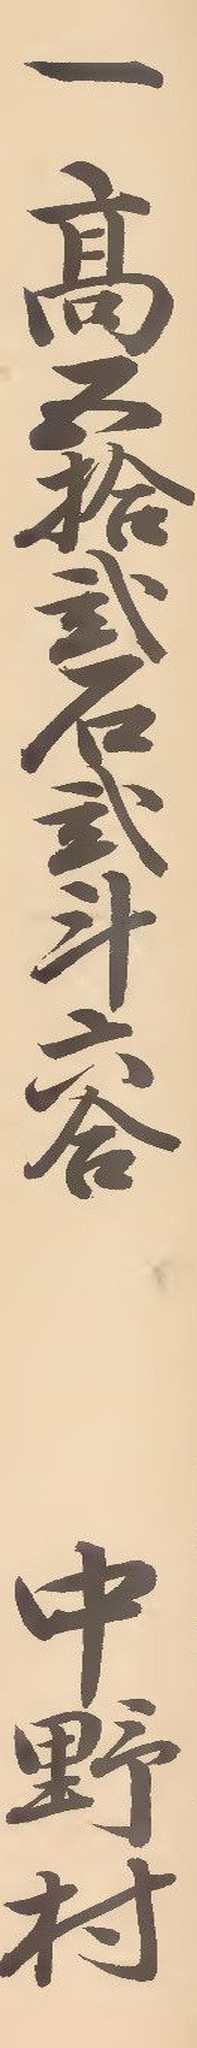一高五拾弐石弐斗六合中野村
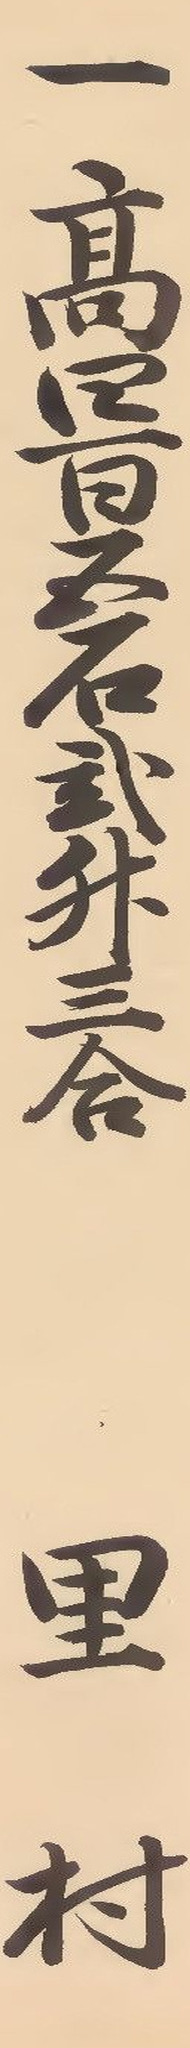一高四百五石弐升三合里村
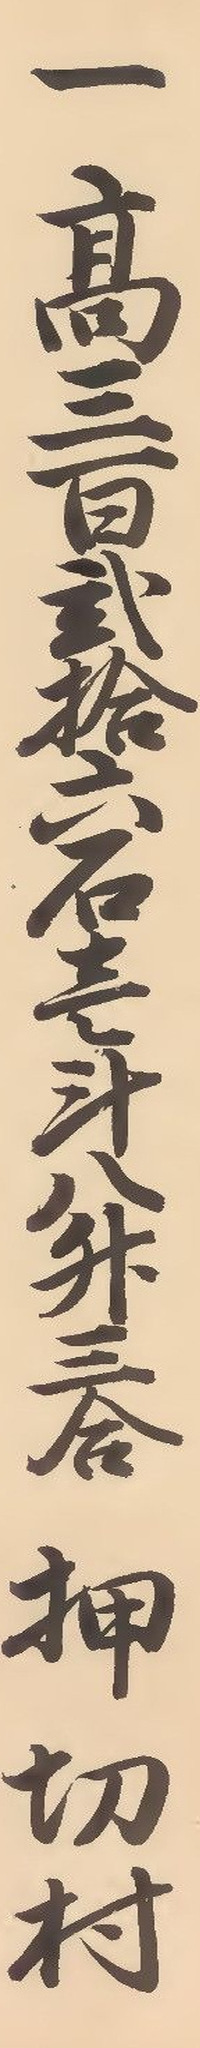一高三百弐拾六石壱斗八升三合押切村
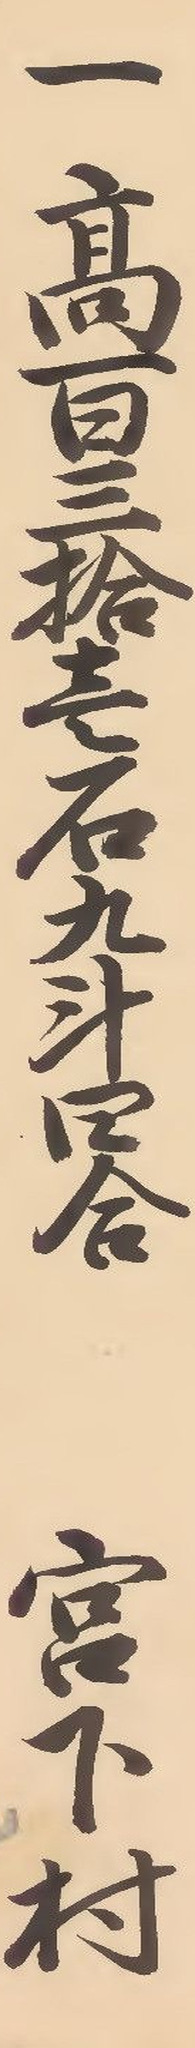一高百三拾壱石九斗四合宮下村

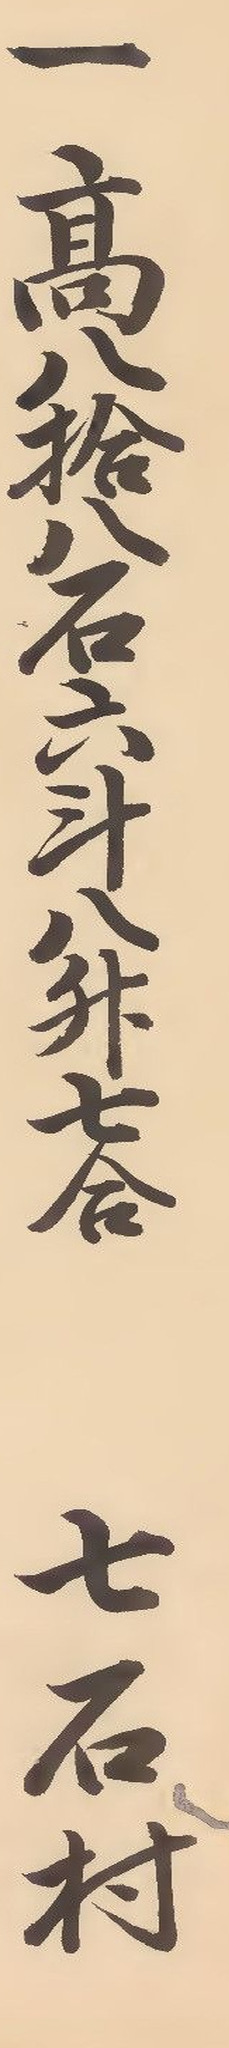一高八拾八石六斗八升七合七石村
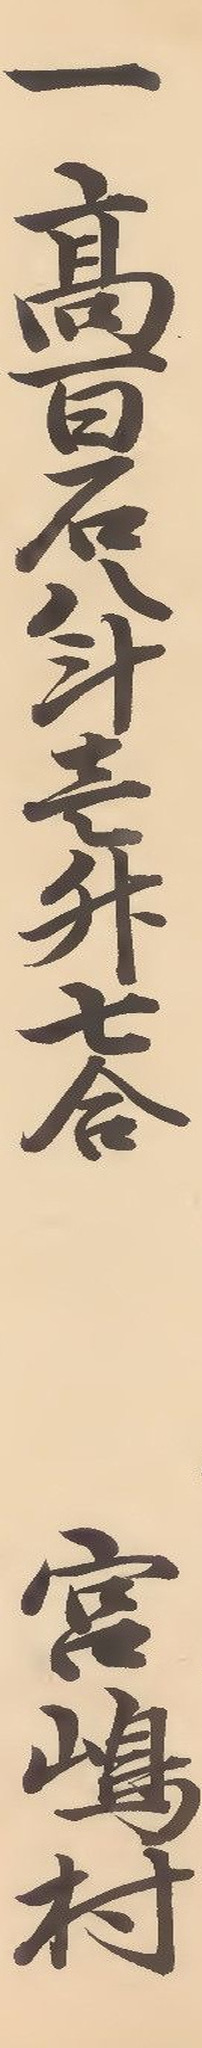一高百石八斗壱升七合宮島村
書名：越後国郷帳　下
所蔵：国立公文書館 National Archives of Japan
